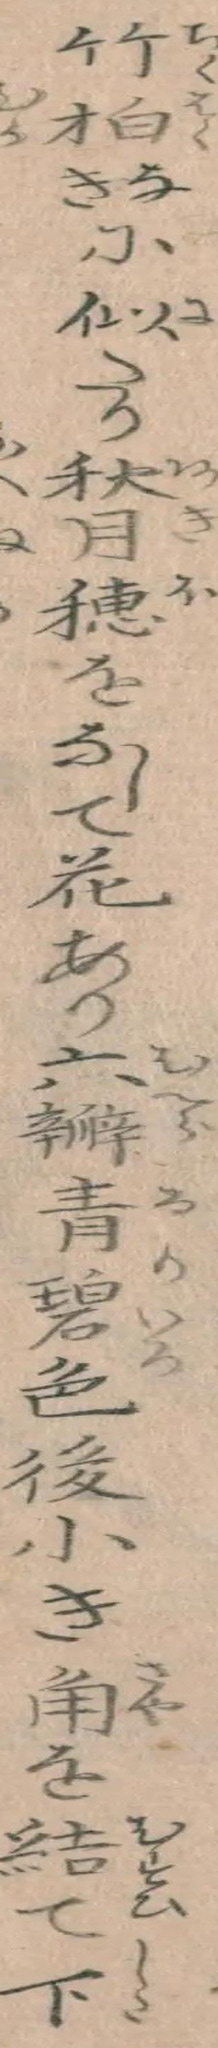竹柏なきに似たり秋月穂をなして花あり六弁青碧色後小き角を結て下
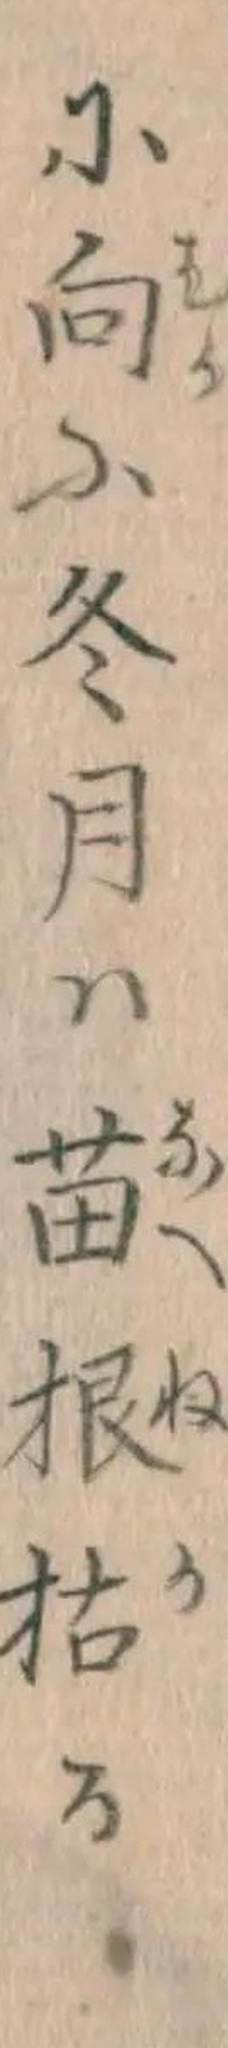に向ふ冬月は苗根枯る
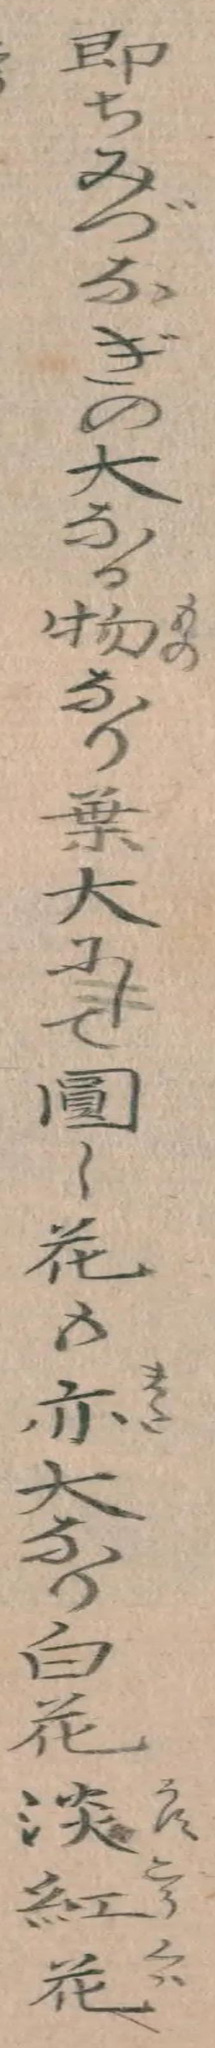即ちみづなぎの大なる物なり葉大にして円し花も亦大なり白花淡紅花

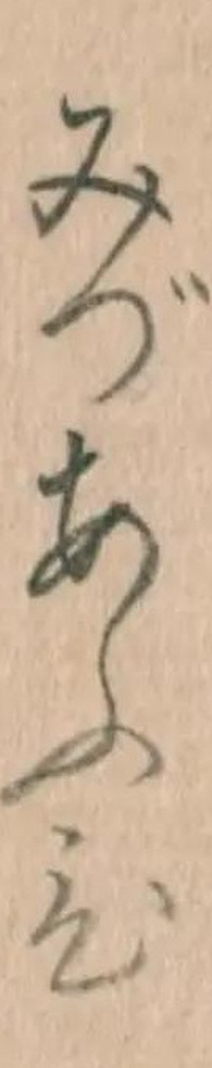みづあふひ
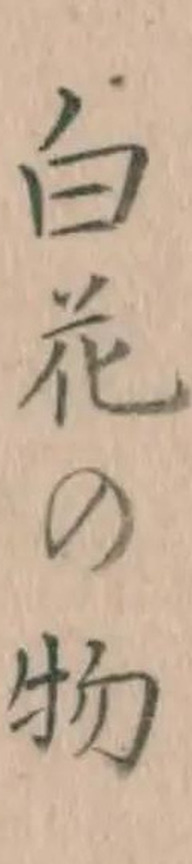白花の物
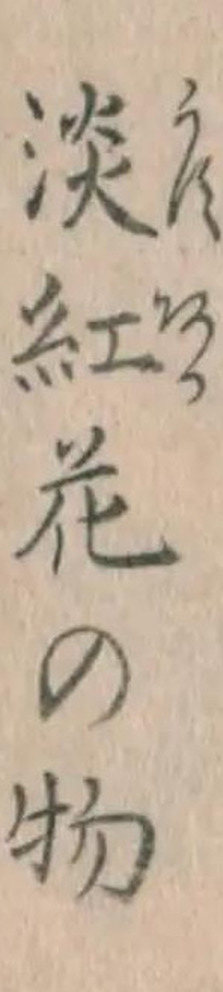淡紅花の物

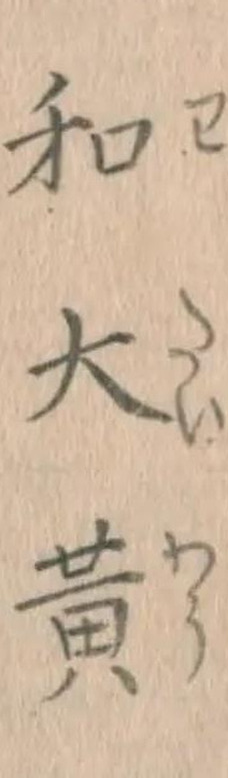和大黄
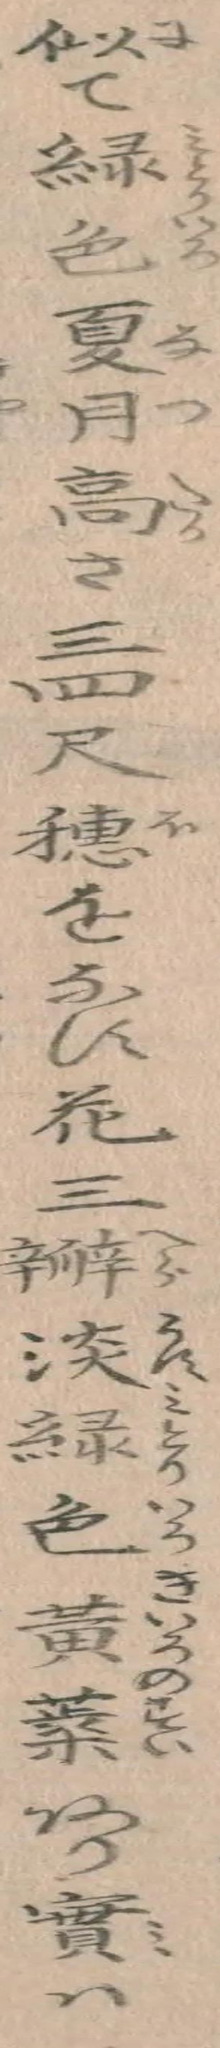似て緑色夏月高さ三四尺穂をなす花三弁淡緑色黄蕊あり実は
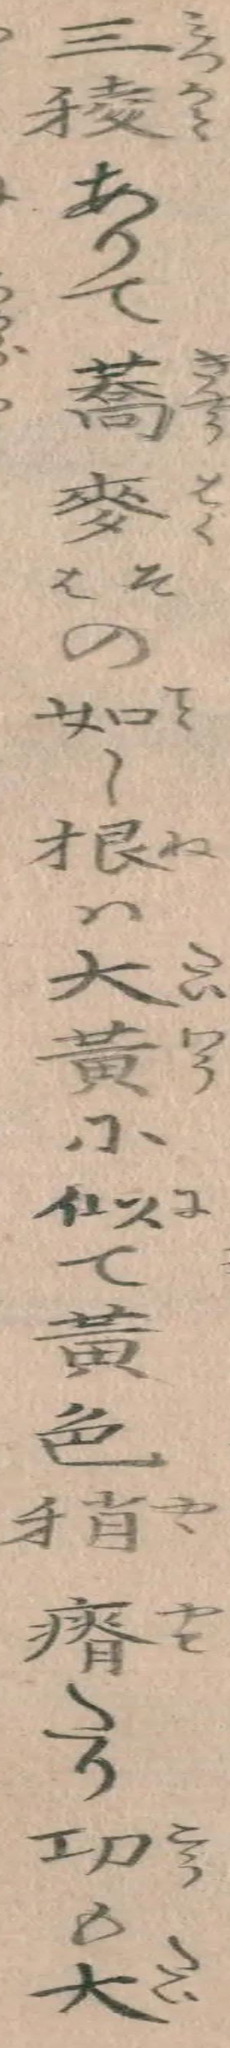三稜ありて蕎麦そはの如し根は大黄に似て黄色稍瘠たり功も大
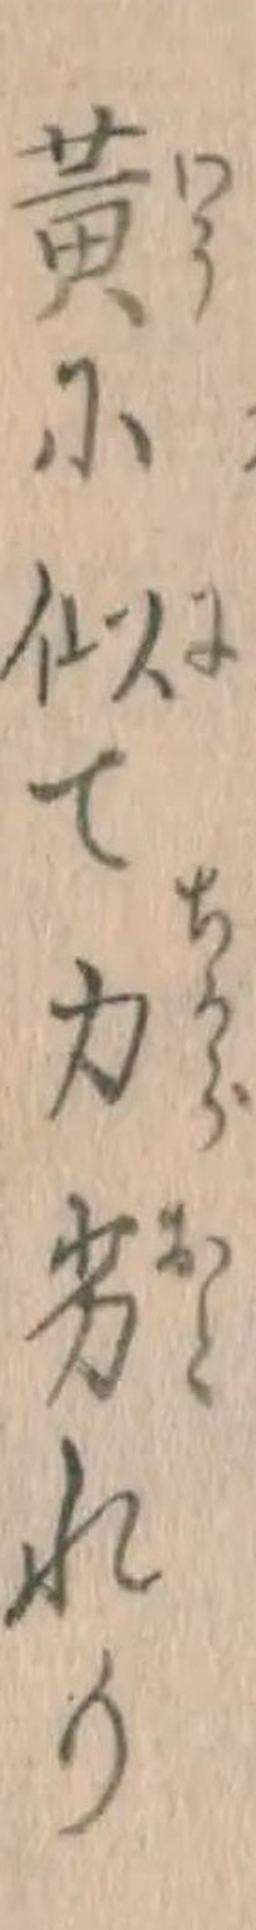黄に似て力劣れり
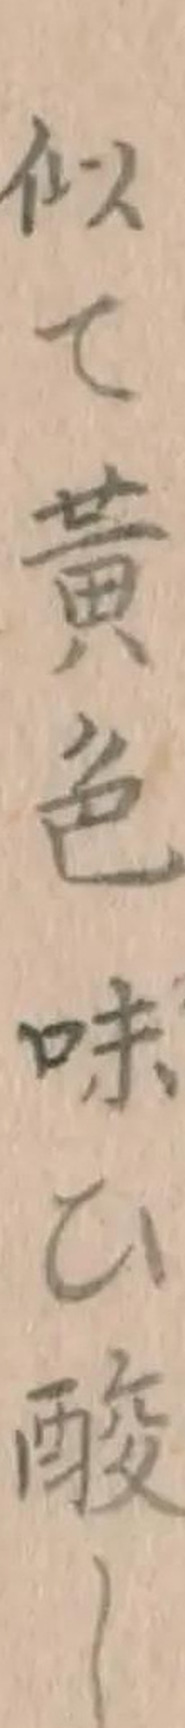似て黄色味ひ酸し
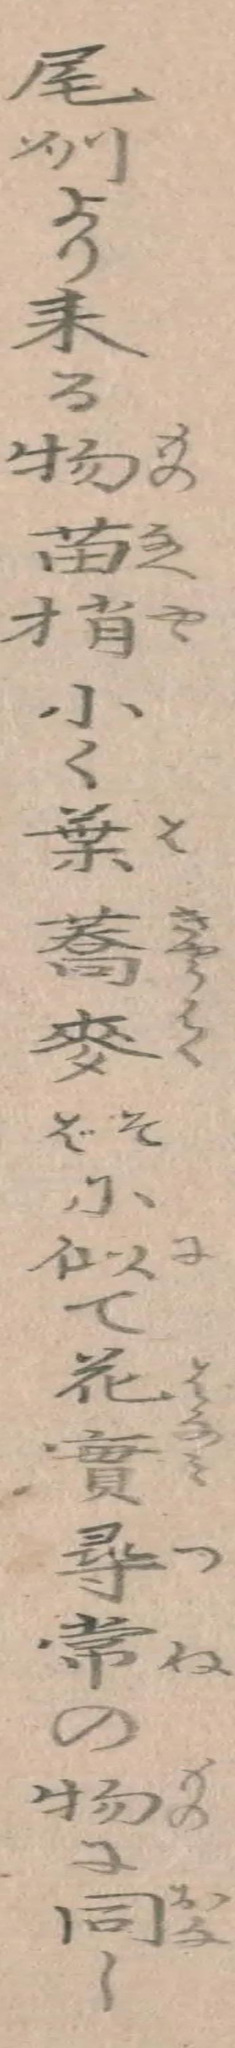尾州より来る物苗稍小く葉蕎麦そばに似て花実尋常の物に同し

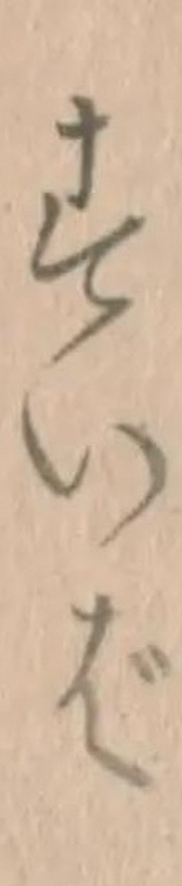すいば

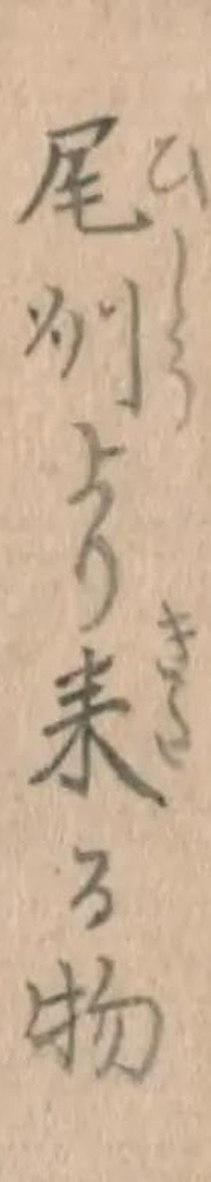尾州より来る物
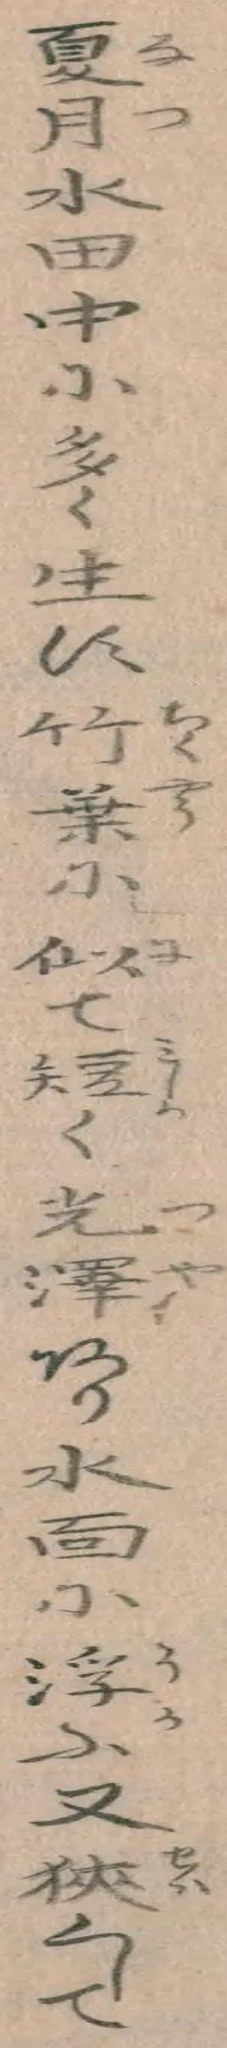夏月水田中に多く生す竹葉に似て短く光沢あり水面に浮ふ又狭くして
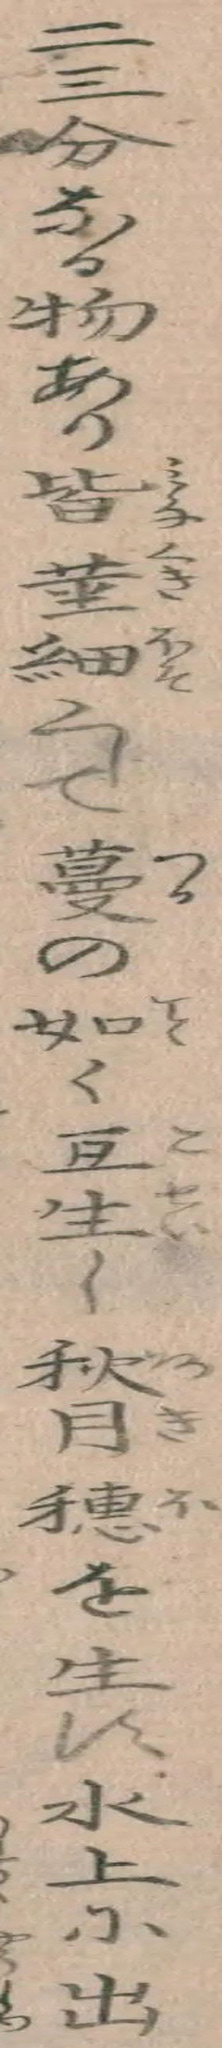二三分なる物あり皆茎細くして蔓の如く互生し秋月穂を生す水上に出
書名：本草図譜. 巻31-33
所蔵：国立国会図書館 National Diet Library, JAPAN
